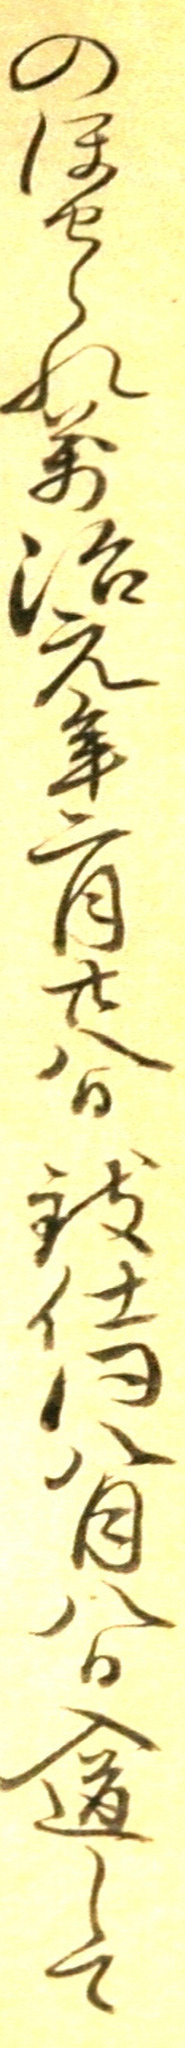のほせられ万治元年二月廿八日致仕同八月八日入道して
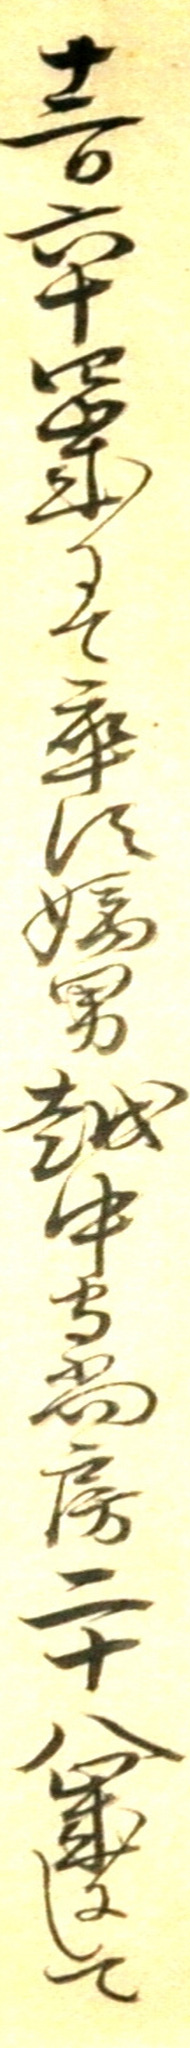十二日六十四歳にて卒す嫡男越中守尚房二十八歳にして
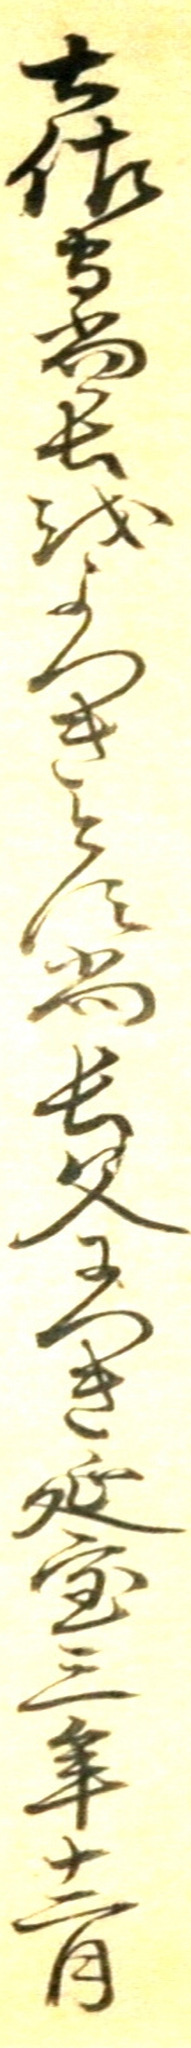土佐守尚長をよつきとす尚長父につき延宝三年十二月
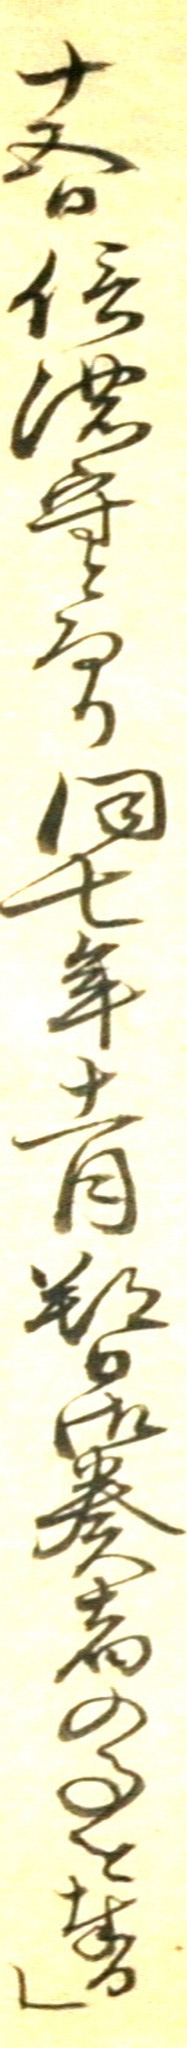十五日信濃守となり同七年十一月朔日御奏者の事を奉る」
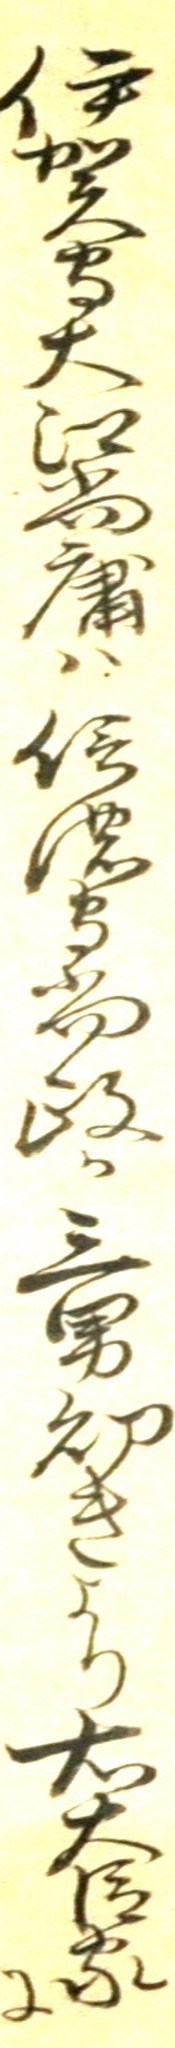伊賀守大江尚庸は信濃守尚政か三男幼きより右大臣家に
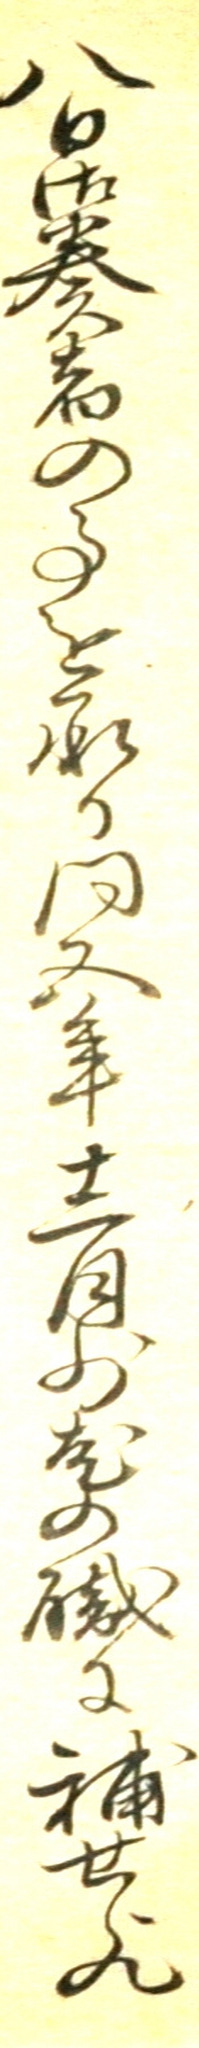八日御奏者の事を承り同五年十二月少老の職に補せられ
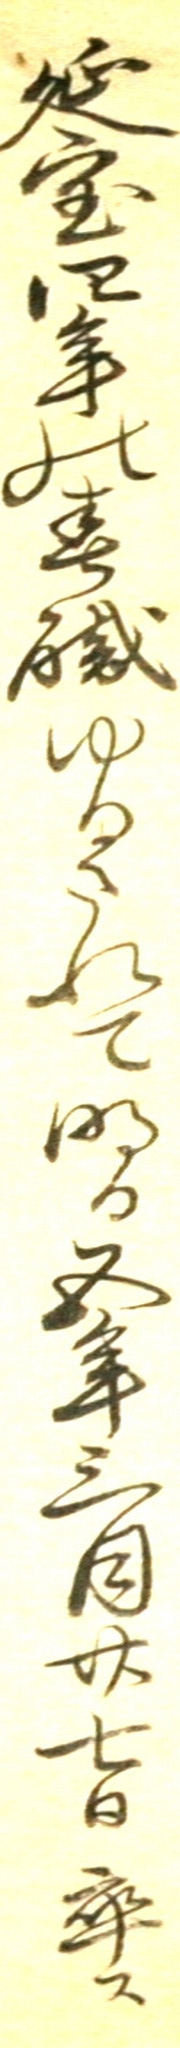延宝四年の春職ゆるされて明る五年三月廿七日卒ス
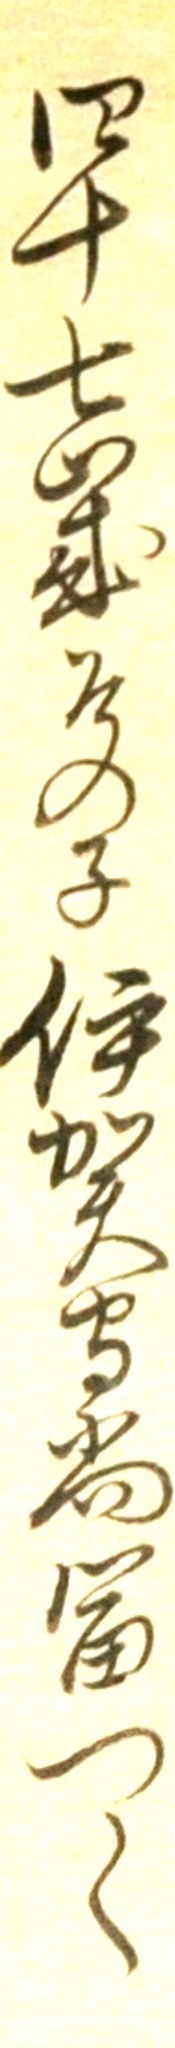四十七歳その子伊賀守尚富つく
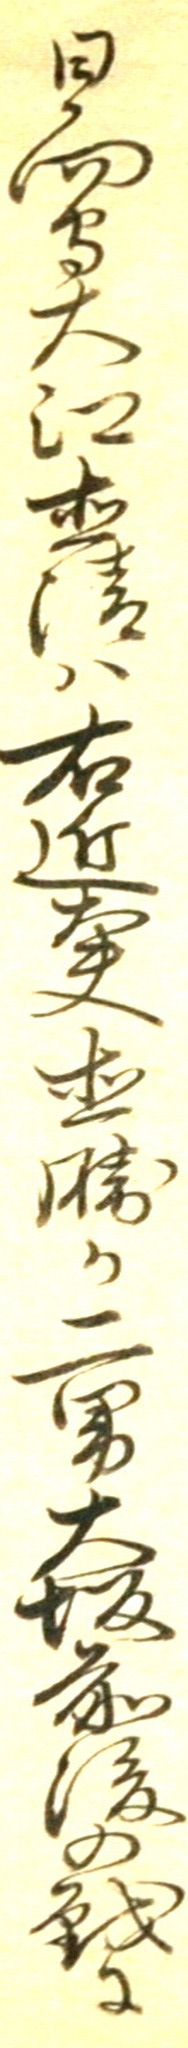日向守大江直清は右近大夫直勝か二男大坂前後の戦に
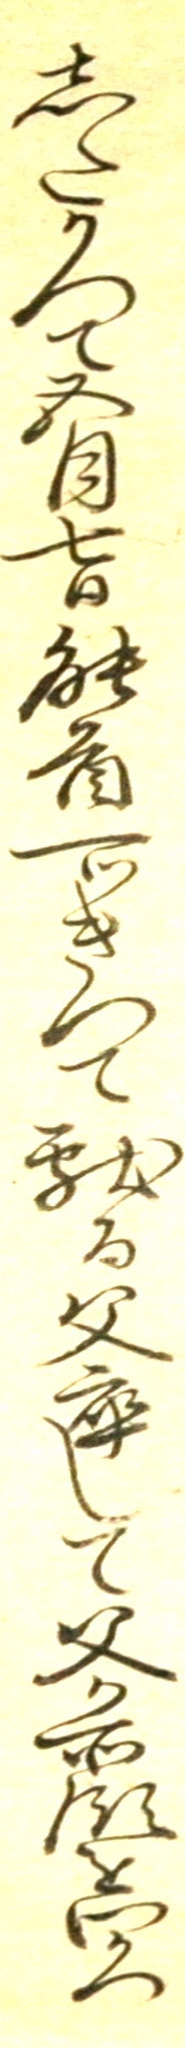したかつて五月七日能首一ッきつて献る父卒して父か所領をわかつ

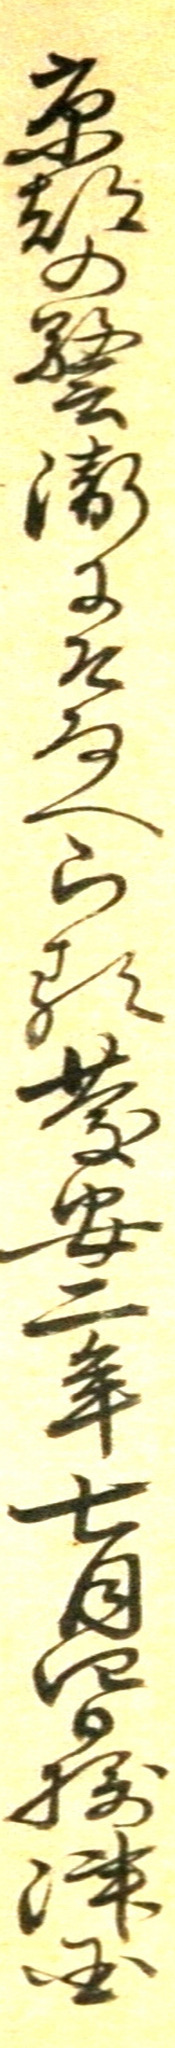京都の警衛にそなへらる慶安二年七月四日摂津国
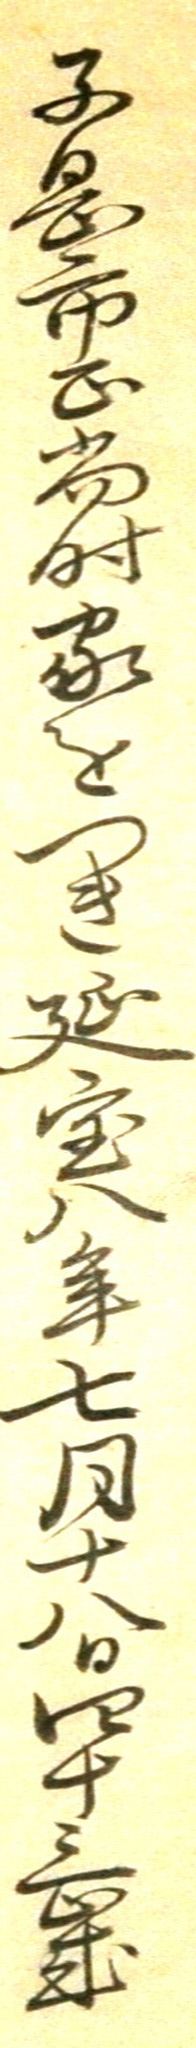子息市正尚時家をつき延宝八年七月十八日四十三歳
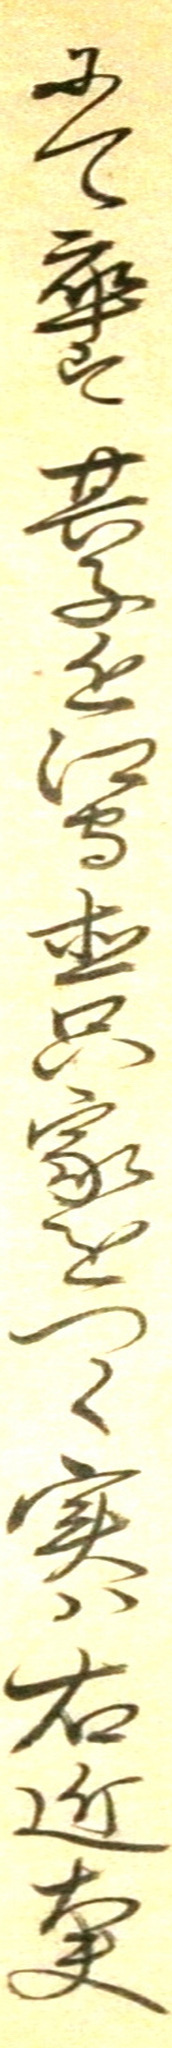にて卒す其子近江守直只家をつく実は右近大夫
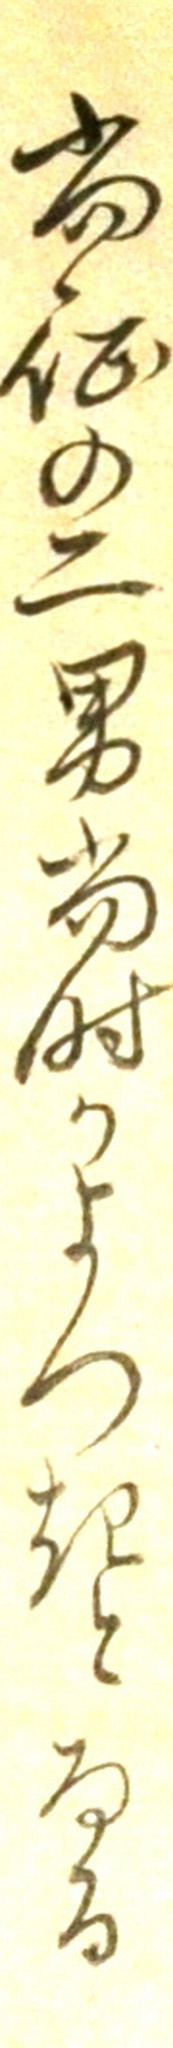尚征の二男尚時かよつきとなる
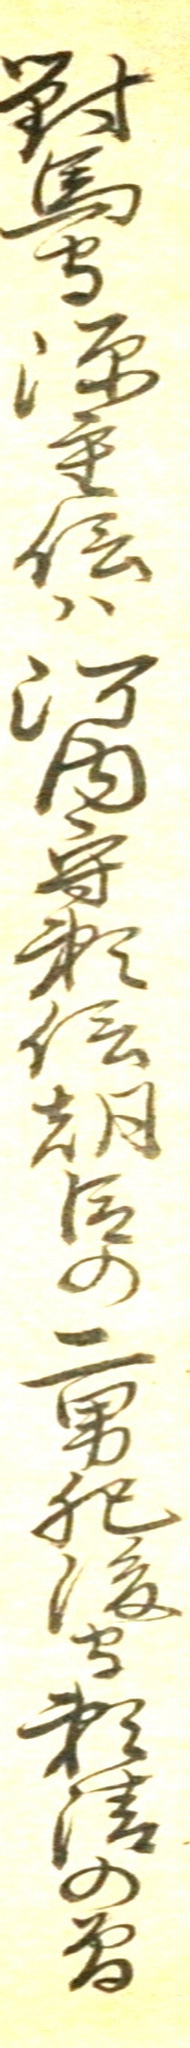対馬守源重信は河内守頼信朝臣の二男肥後守頼清の曽
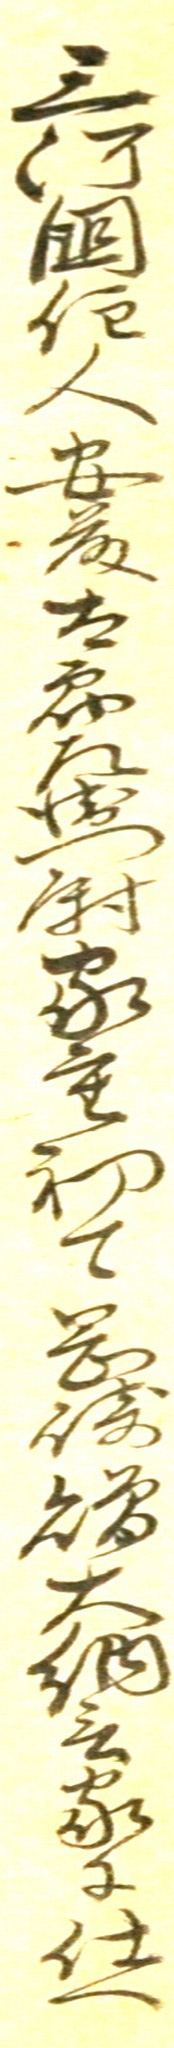三河国住人安藤太郎左衛門尉家重初て岡崎贈大納言家に仕へ
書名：藩翰譜（五）
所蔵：伊那市立高遠町図書館・合同会社AMANE
